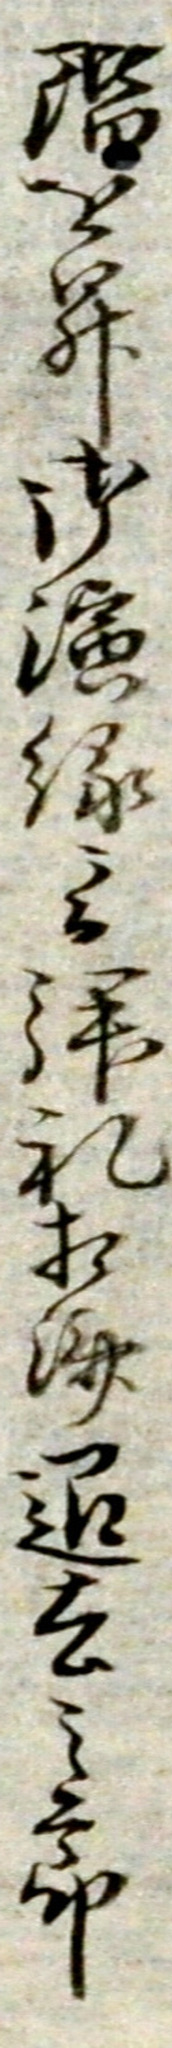階を幷御演縁ニ而拝礼相済退去之節
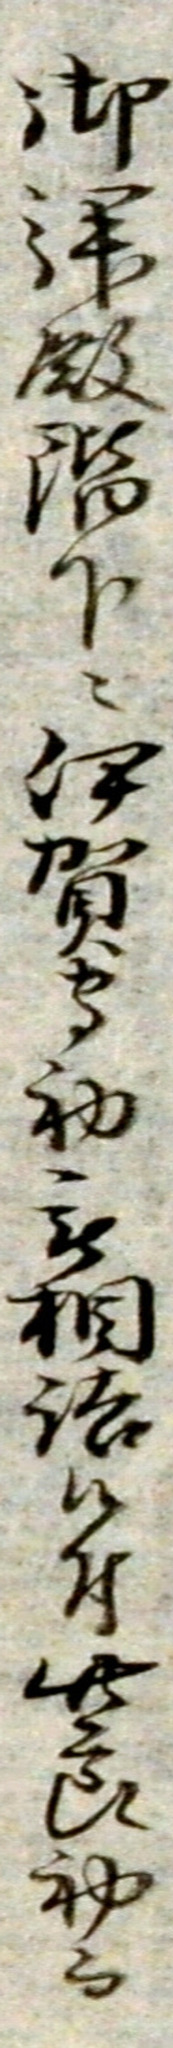御拝殿階下ニ伊賀守初被相詰候付此節初而
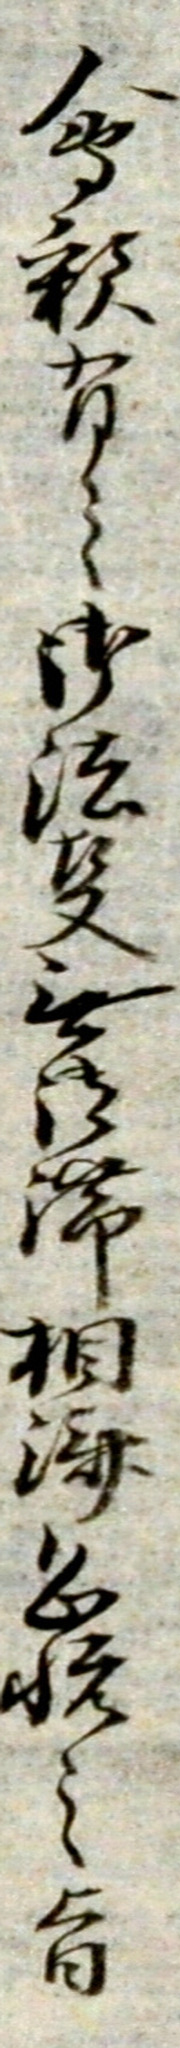会釈有之御法叓無御滞相済恐悦之旨
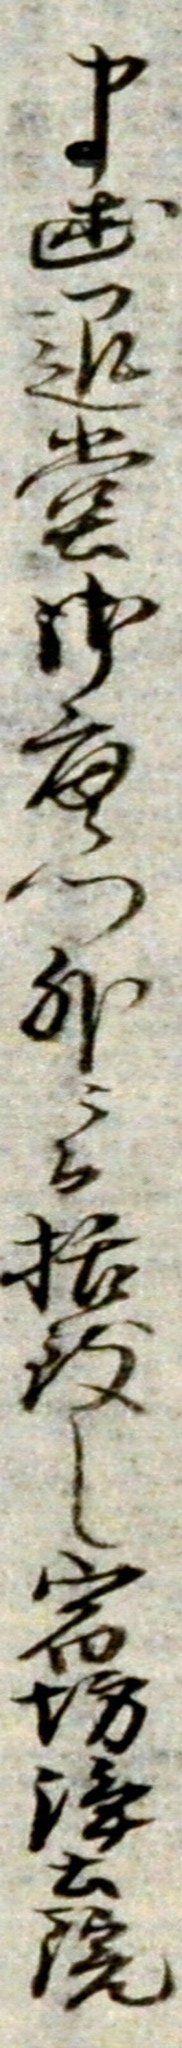申述退堂御唐門外ニ而括致し宿坊浄土院
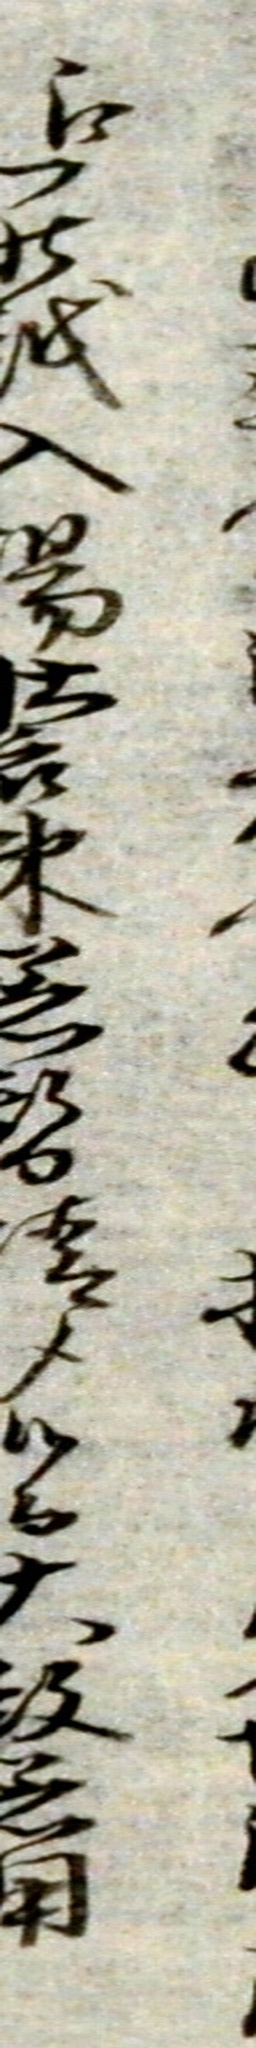江罷越入湯仕装束着替清メ候而大紋着用

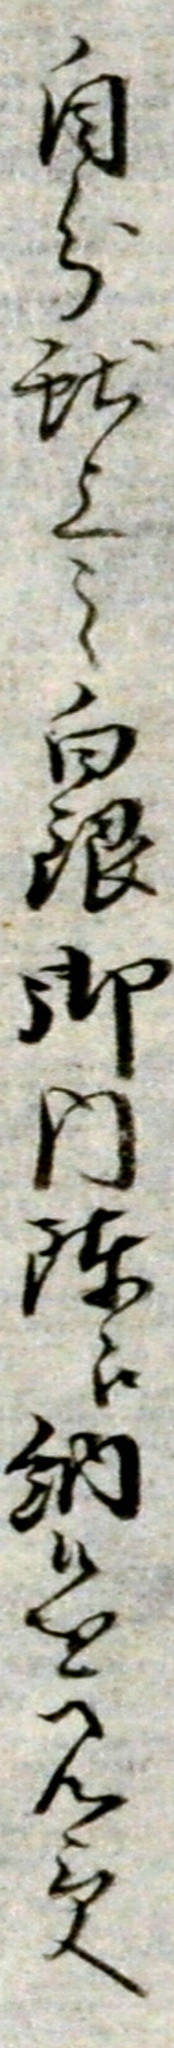自分献上之白銀御内陣江納候を見受
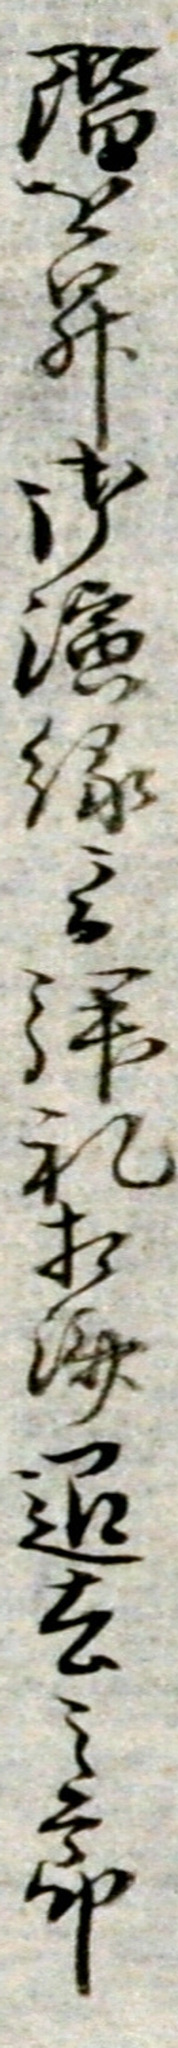階を昇御演縁ニ而拝礼相済退去之節
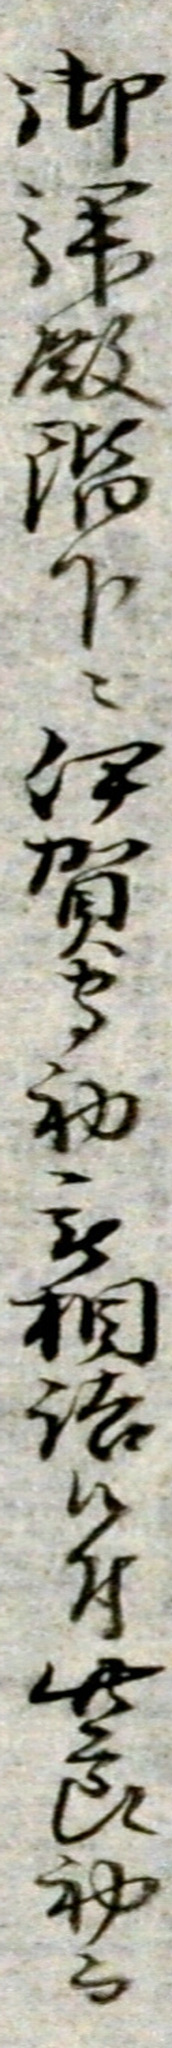御拝殿階下ニ伊賀守初被相詰候付此節初而
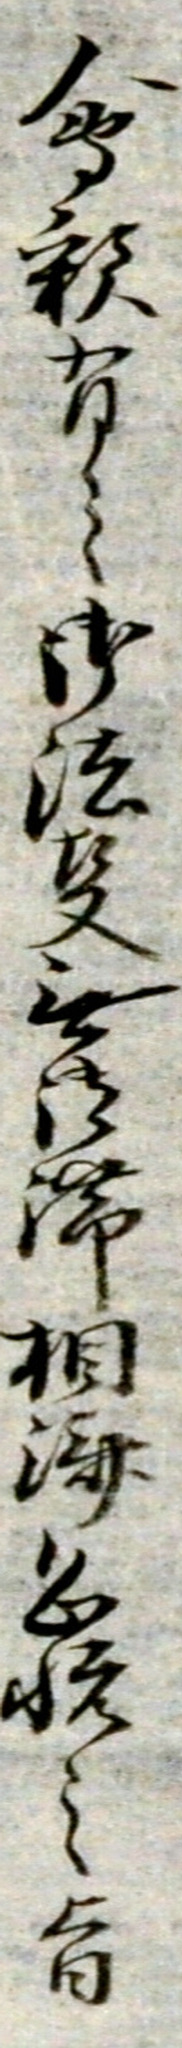会釈有之御法叓無御滞相済恐悦之旨
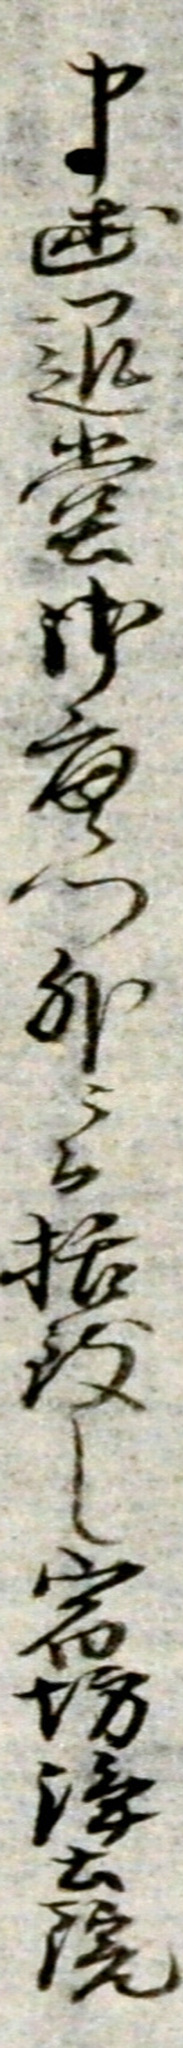申述退堂御唐門外ニ而括致し宿坊浄土院
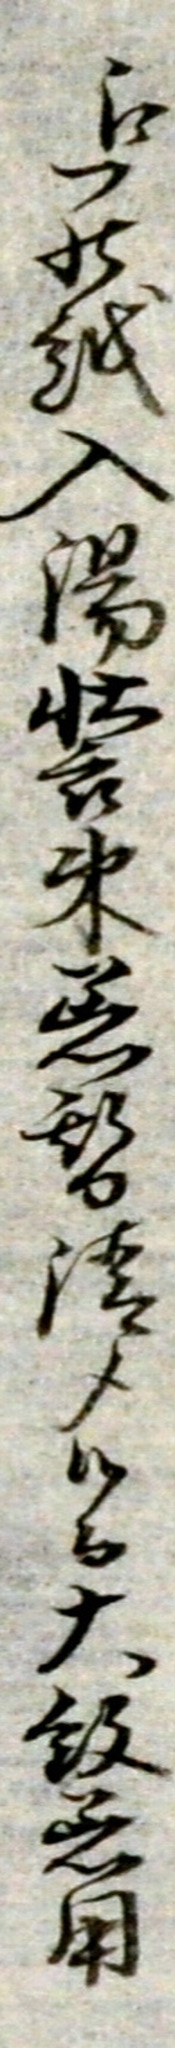江罷越入湯装束着替清メ候而大紋着用
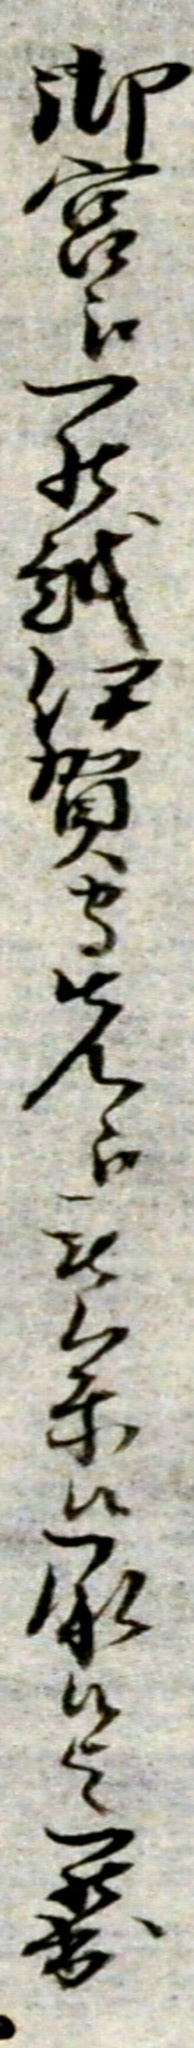御宮江罷越伊賀守先江被参候承候与罷出
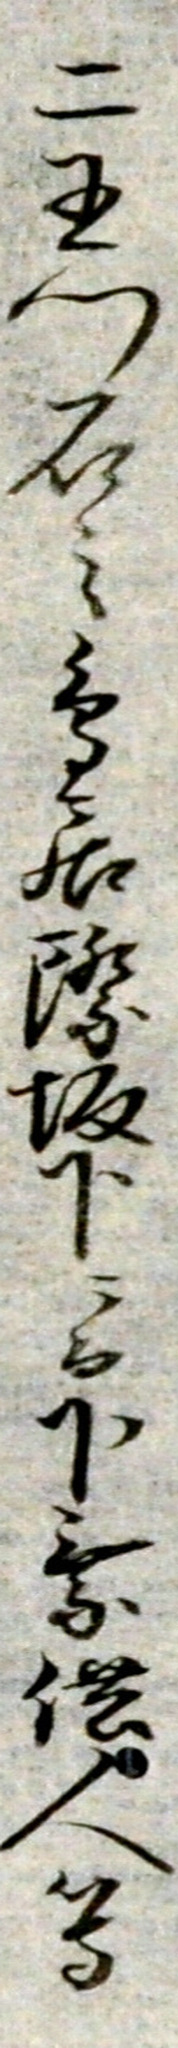ニ王門石之鳥居際坂下ニ而下乗供等
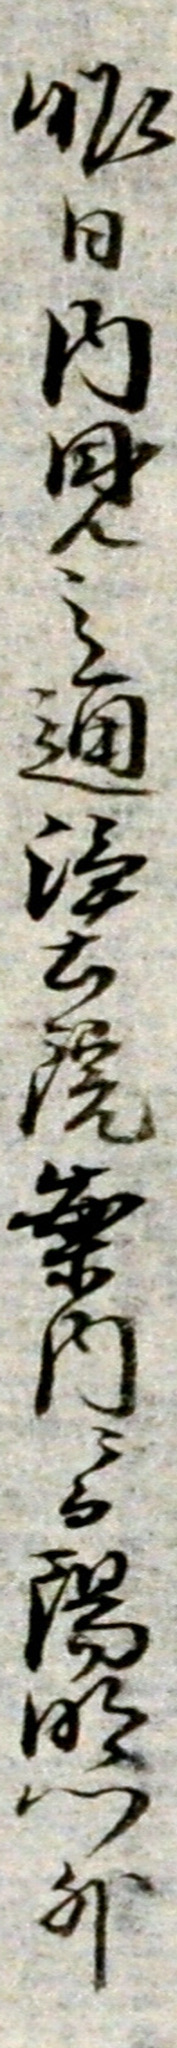昨日内覧之通浄土院案内ニ而陽明門外
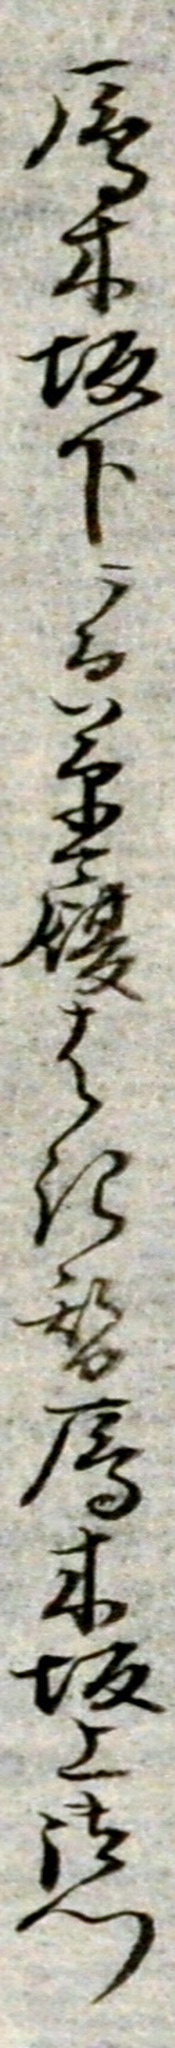雁木坂下ニ而草履はき替雁木坂上御門
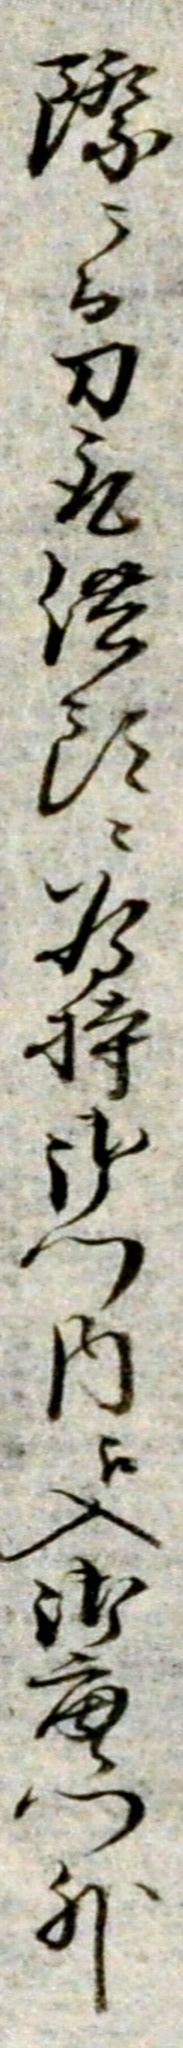際ニ而刀取供頭ニ為持御門内江入御唐門外
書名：日光御名代相勤候節ノ留
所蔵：伊那市立高遠町図書館・合同会社AMANE
